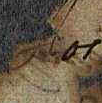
Aos
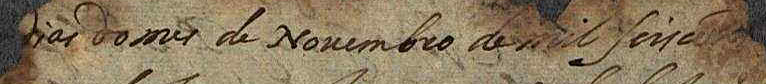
dias do mes de Nouembro de mil seiscentos
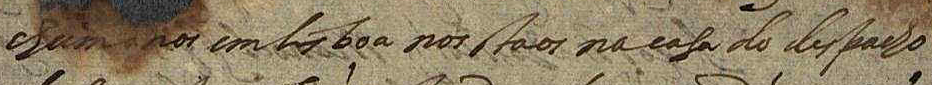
e hum nos em lisboa nos staos na casa do despacho
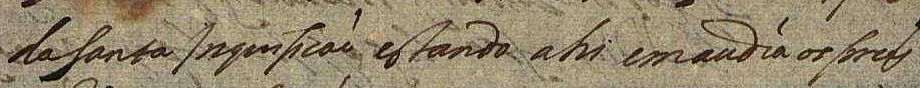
da Santa Jnquisiçaõ estando ahi em audiā os snres̄
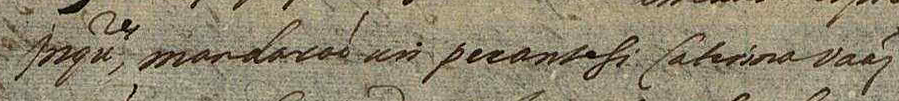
jnqures, mandaraõ uir perante si Caterina vaaz̄
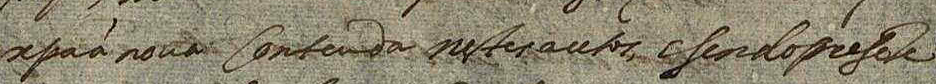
xpaā noua Conteuda nestes autos, E sendo presēte
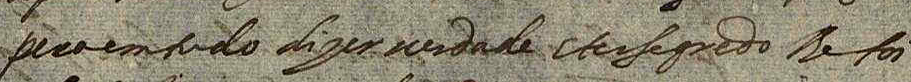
pera em tudo dizer uerdade e ter segredo lhe foi
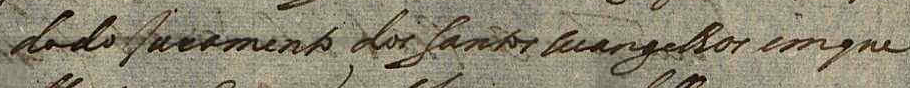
dado juramento dos santos euangelhos em que
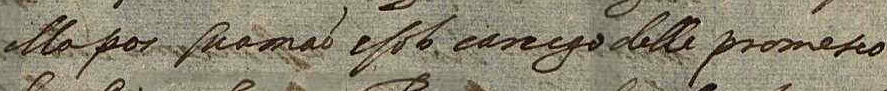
ella pos sua maõ e sob carrego delle prometeo
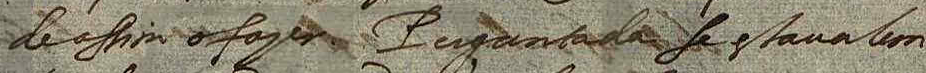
de assim o fazer. Perguntada se estaua lem
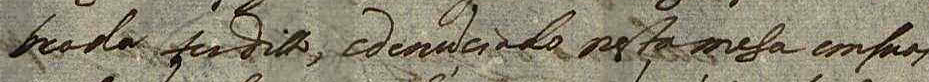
brada ter ditto, e denūciado nesta mesa em suas
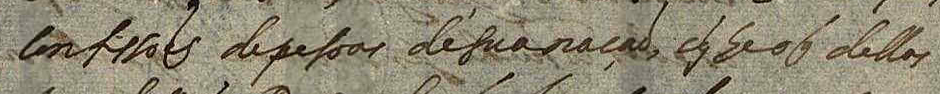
confissoẽs de pesoas de sua naçaõ, e q̄ he o q̄ dellas
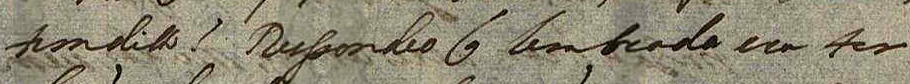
tem ditto? Respondeo q̄ lembrada era ter
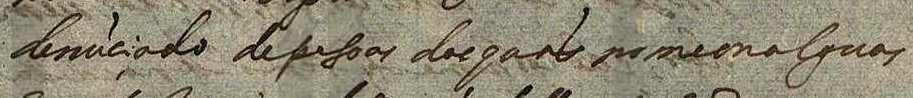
denūciado de pesoas das quais nomeou alguas
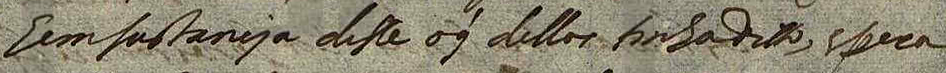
E em sustancja disse o q̄ dellas tinha ditto, E pera
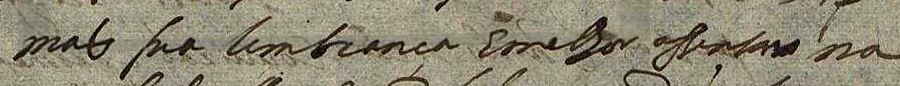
mais sua lembrança E melhor assentar na
